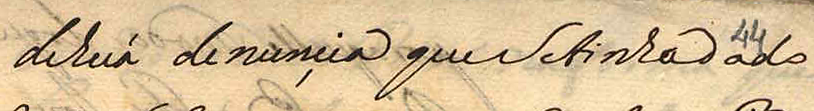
de huā denuncia que se tinha dado
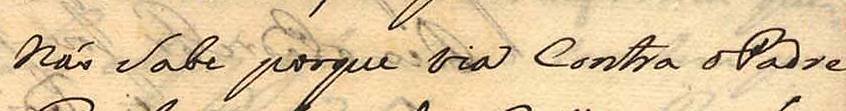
não sabe porque via Contra o Padre
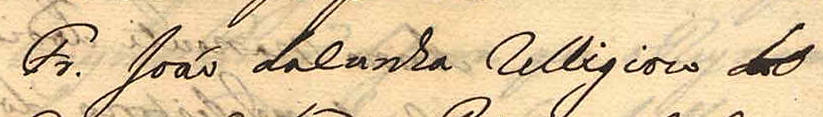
Fr. Joaõ da Cunha Relligiozo do
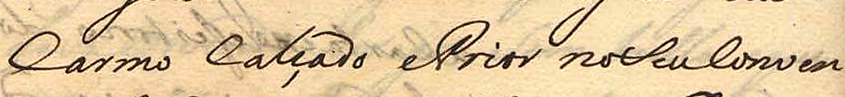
Carmo Calçado e Prior no Seu Conven
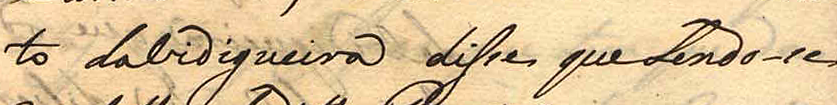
to da vidigueira disse que Lendo-se
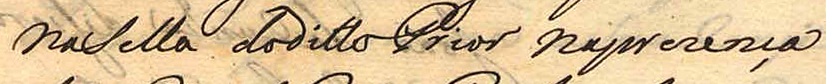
na Sella do ditto Prior na prezença
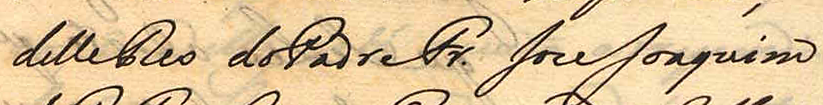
delle Reo do Padre Fr. Joze Joaquim
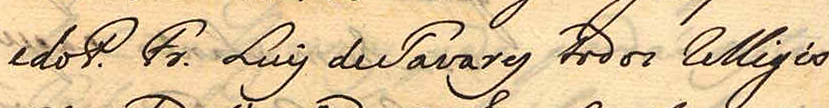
e do P. Fr. Luis de Tavares todos Relligio
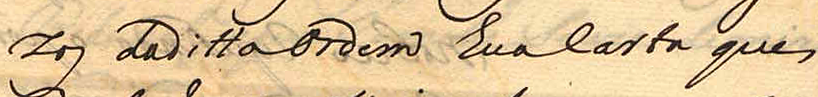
zos da ditta ordem hua carta que
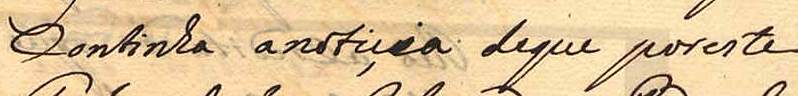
Continha a noticia de que por este
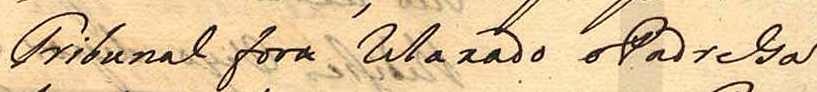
Tribunal fora Relaxado o Padre Ga
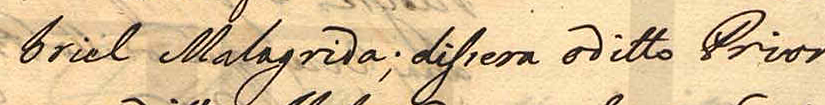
briel Malagrida; dissera o ditto Prior
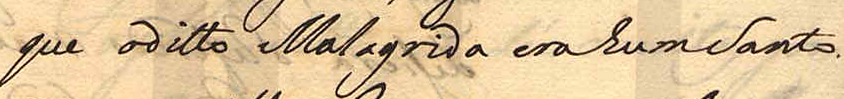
que o ditto Malagrida era hum Santo
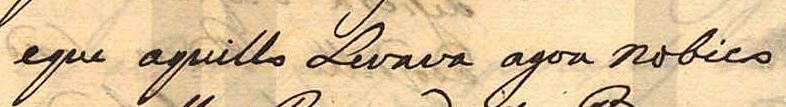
e que aquillo Levava agoa no bico
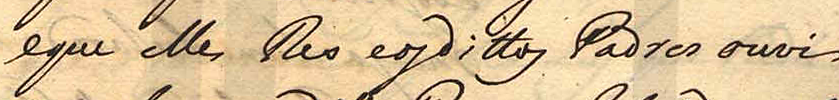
e que elle Reo e os dittos Padres ouvi
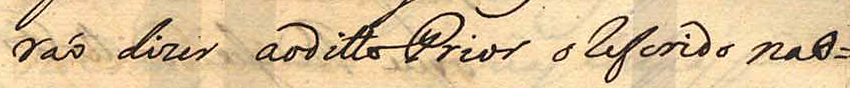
raõ dizer ao ditto Prior o Referido na O
